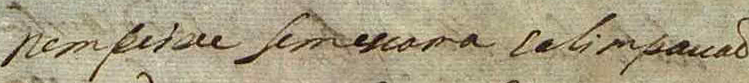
nem peixe sem escama E alimpauaõ
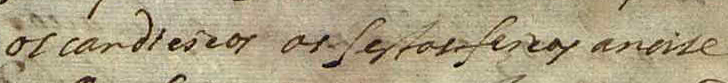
os candieiros as sestas feiras a noite
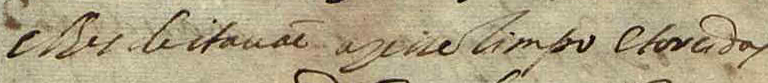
E lhes deitauaõ azeite limpo E torcidas
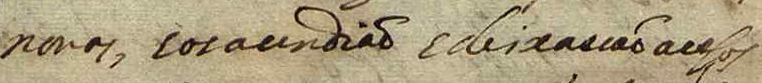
nouas, E os acendiaõ E deixauaõ acesos
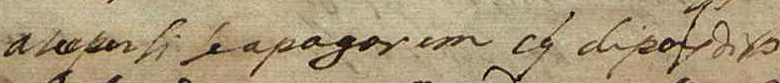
atee per si se apagarem E q̄ dipois disso
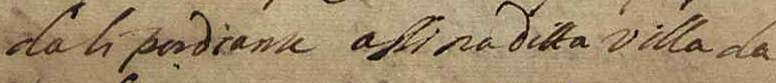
dali por diante assi na ditta villa da
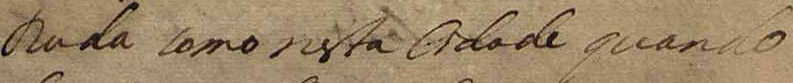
Ruda como nesta Cidade quando
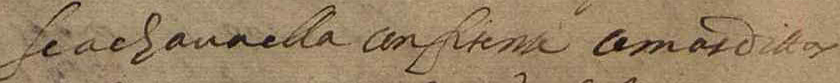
se achaua ella confitente com as dittas
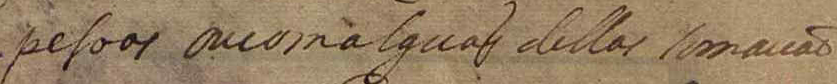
pesoas ou com alguas dellas tornauaõ
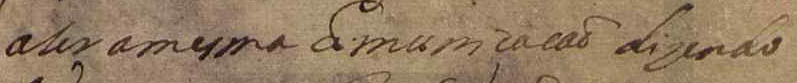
a ter a mesma cōmunicaçaõ dizendo
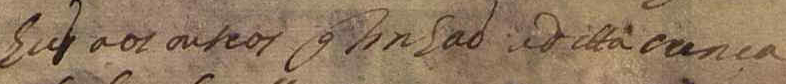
hus aos outros q̄ tinhaõ a ditta crença
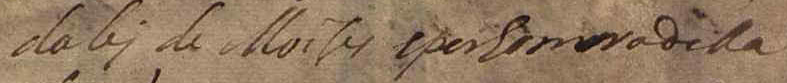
da lej de Moises e per homrra della
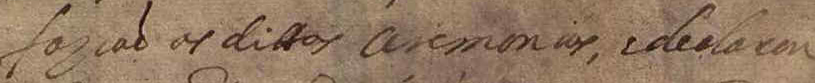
faziaõ as dittas ceremonias E declarou
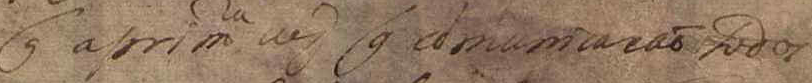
q̄ a primra uez q̄ cōmunicaraõ todos
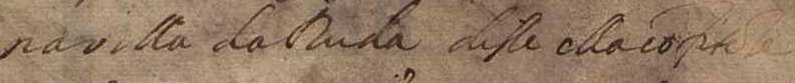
na villa da Ruda disse ella cōfitēte
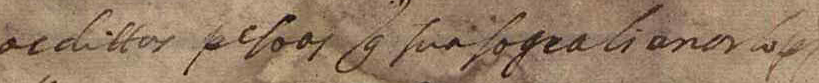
as dittas pesoas q̄ sua sogra lianor lopez̄
